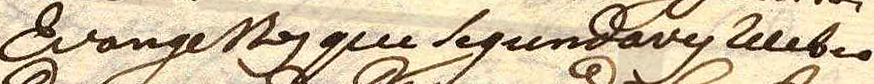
Evangelhos que segunda ves Recebeo
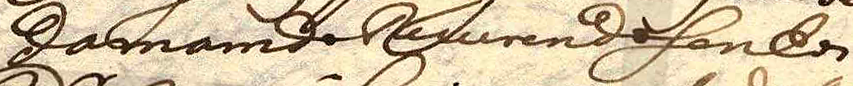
da mam do Reuerendo Senhor
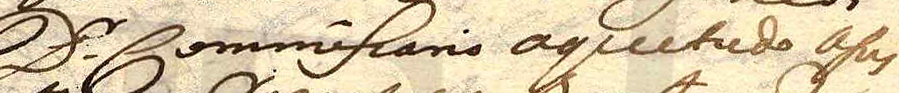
D.r Commissario a que tudo assis
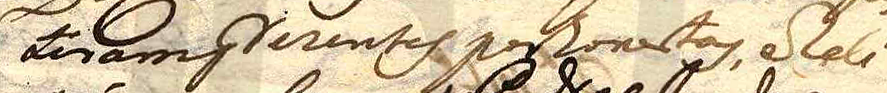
tiram prezentes por honestas, e Reli
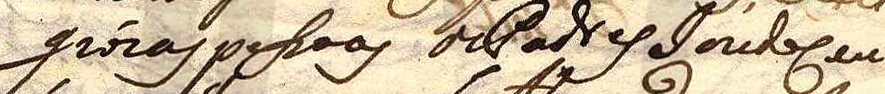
giozas pessoas os Padres Ioze do Cou
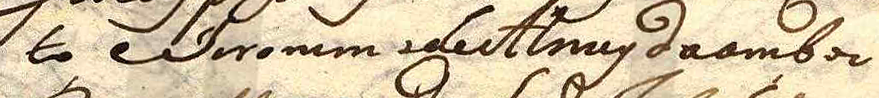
to e Ieronimo de Almeyda ambos
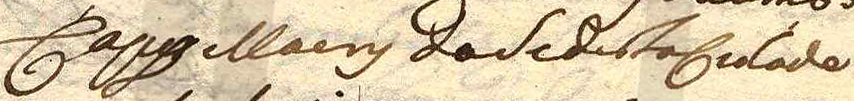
Cappellaens da Se desta Cidade
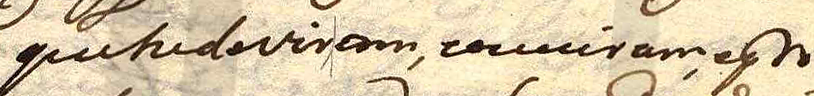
que tudo viram, e ouuiram, e pro
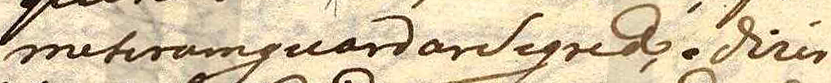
meteram guardar segredo, e dizer
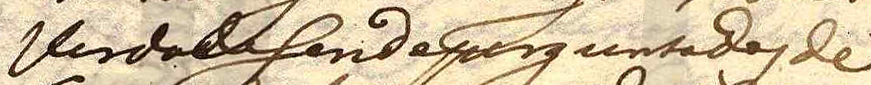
Verdade sendo perguntados de
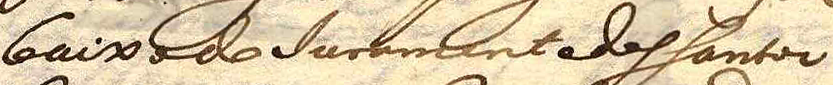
baixo do Iuramento dos Santos
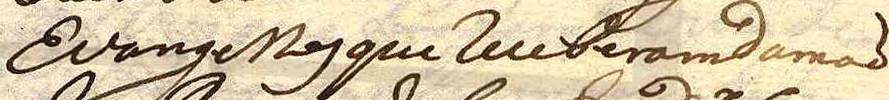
Evangelhos que Receberam da maõ
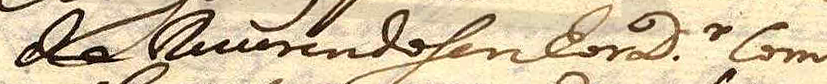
do Reuerendo Senhor D.r Com
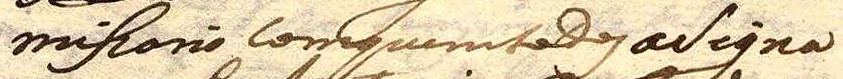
missario com quem todos aSigna
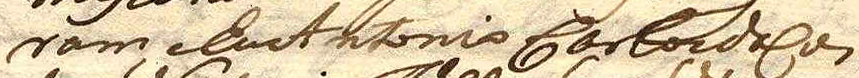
ram, e Eu Antonio Carlos da Cos
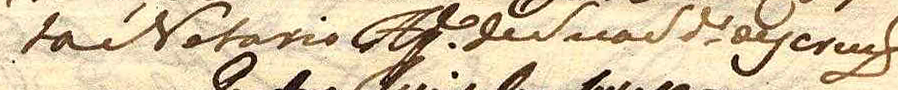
ta Notario Ap.co de Sua Sd.e o escreuj
